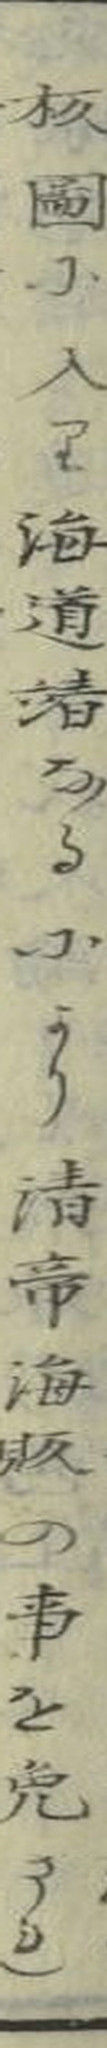板図に入り海道靖なるにより清帝海販の事を免され
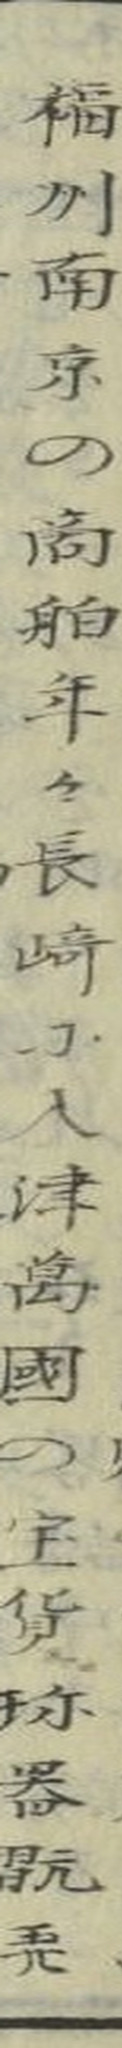福州南京の商舶年々長崎に入津万国の宝貨珍器翫弄
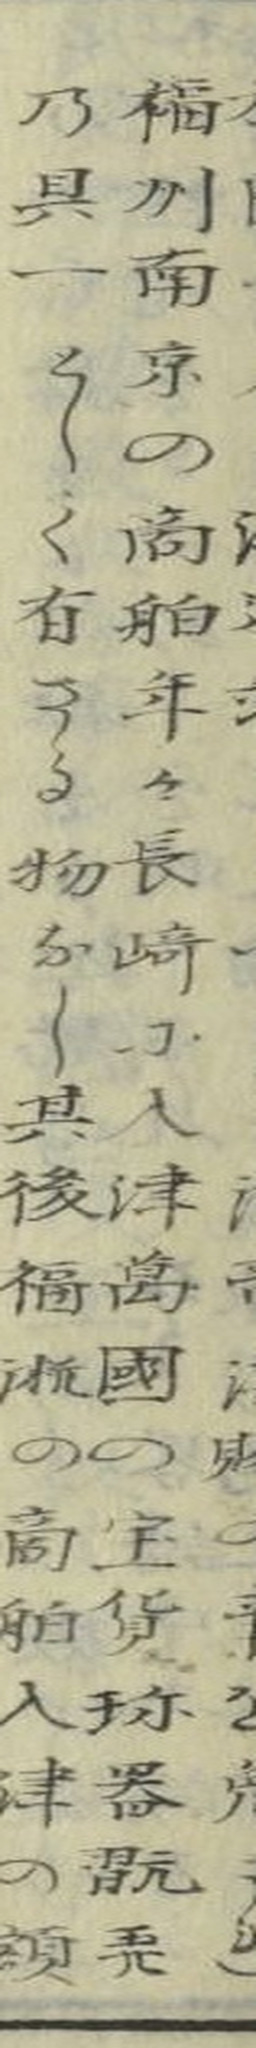の具一として有さる物なし其後福淅の商舶入津の額
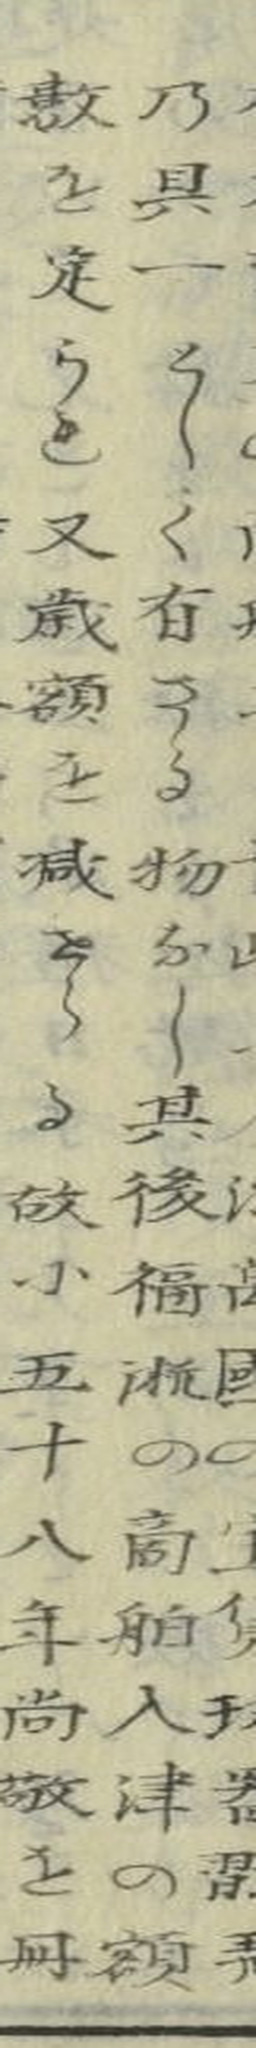数を定られ又歳額を減せらる故に五十八年尚敬を冊
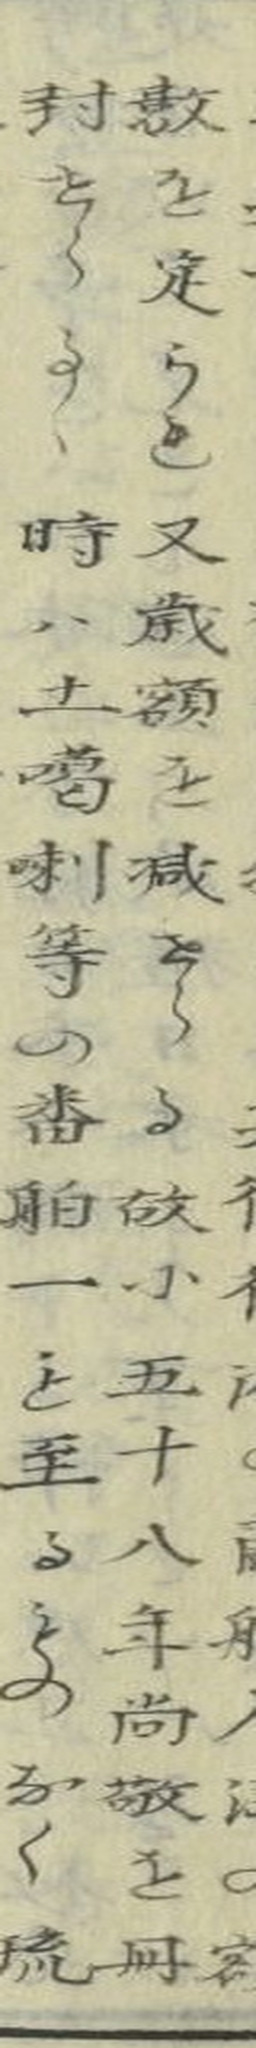封せらるヽ時は土噶喇等の番舶一も至るものなく琉
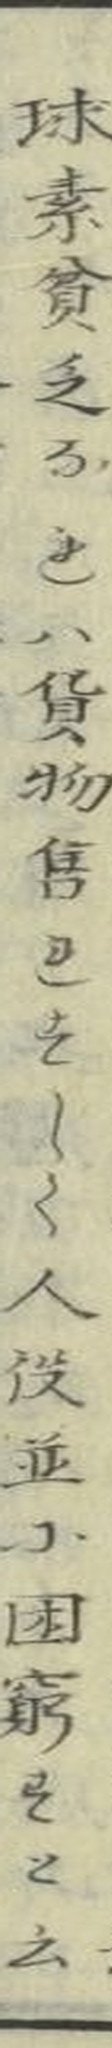球素貧乏なれは貨物售れすして人役並に困窮すと云
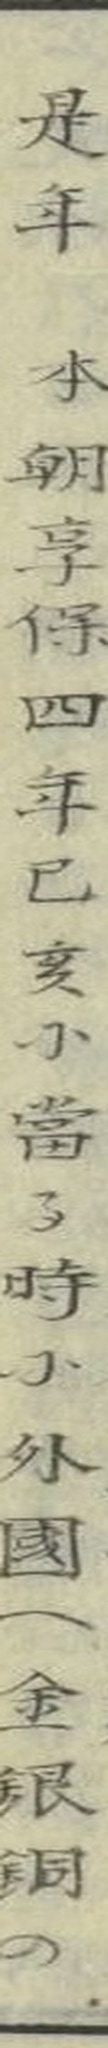是年本朝享保四年己亥に当る時に外国へ金銀銅の
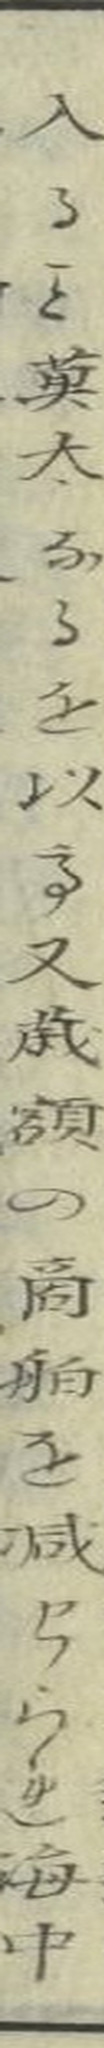入ること莫太なるを以て又歳額の商舶を減せられ海中
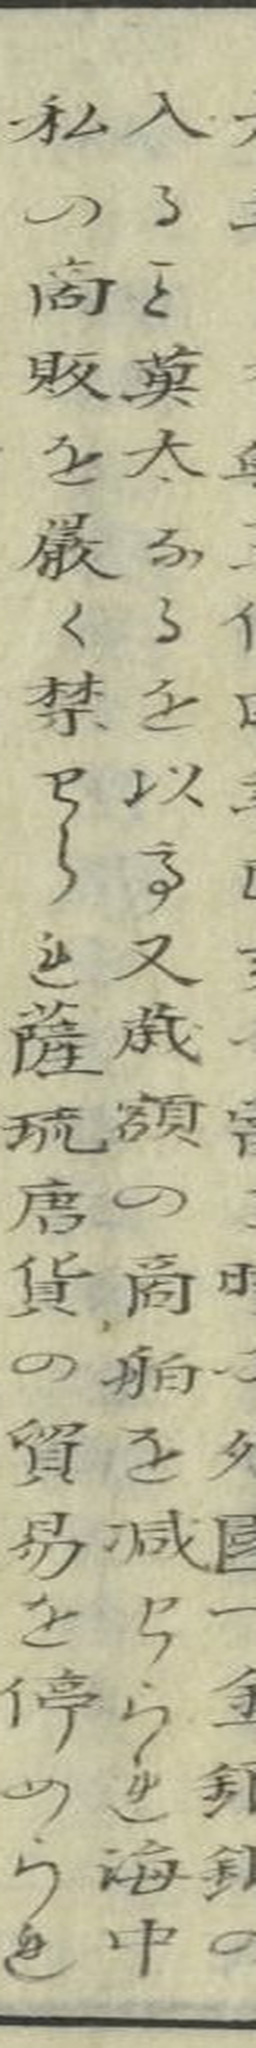私の商販を厳く禁せられ薩琉唐貨の貿易を停められ
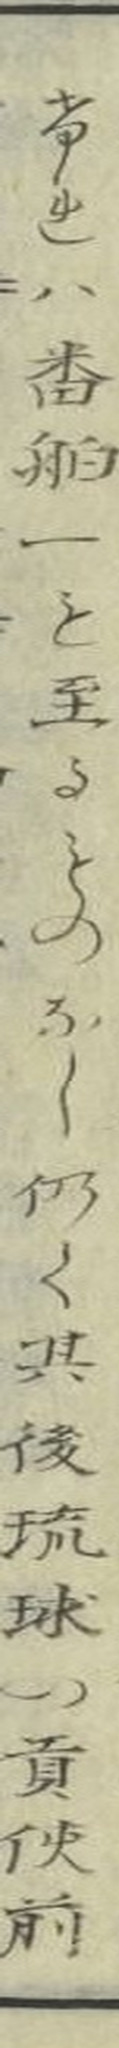けれは番舶一も至るものなし仍て其後琉球の貢使前
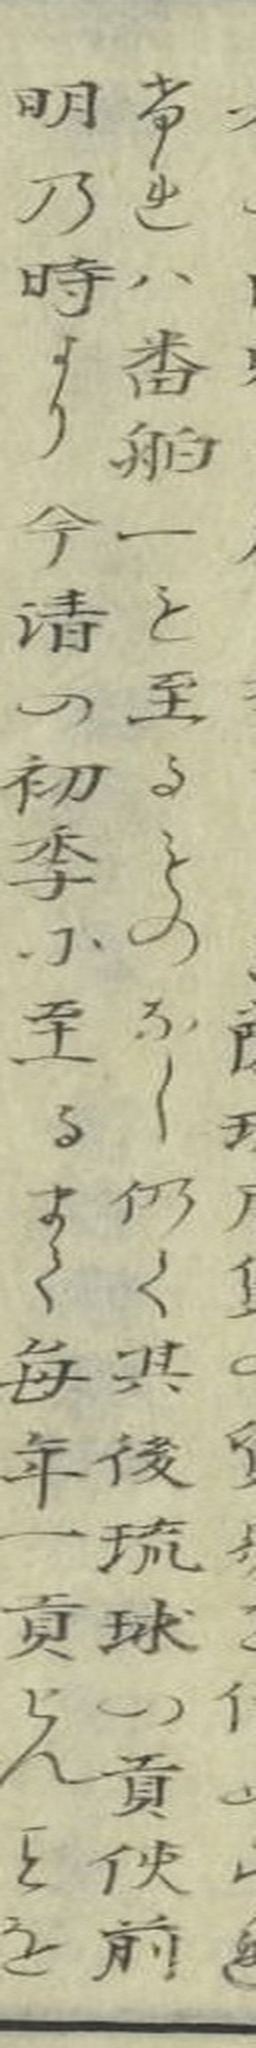明の時より今清の初季に至るまて毎年一貢せんことを
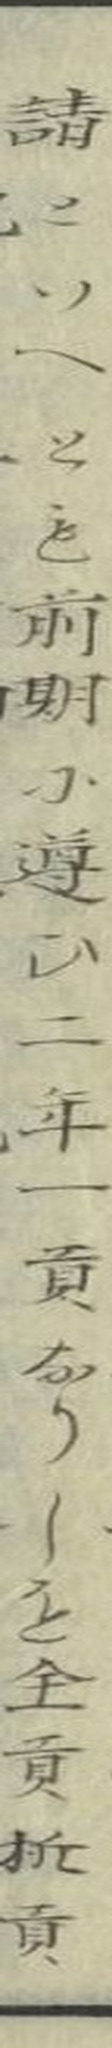請といへとも前期に遵ひ二年一貢なりしを全貢折貢
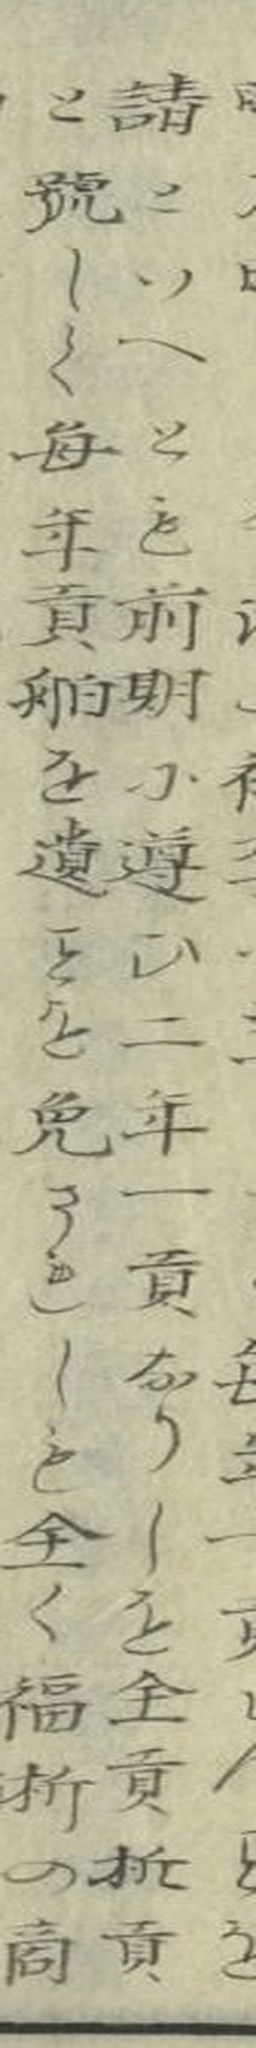と號して毎年貢舶を遺ことを免されしも全く福淅の商
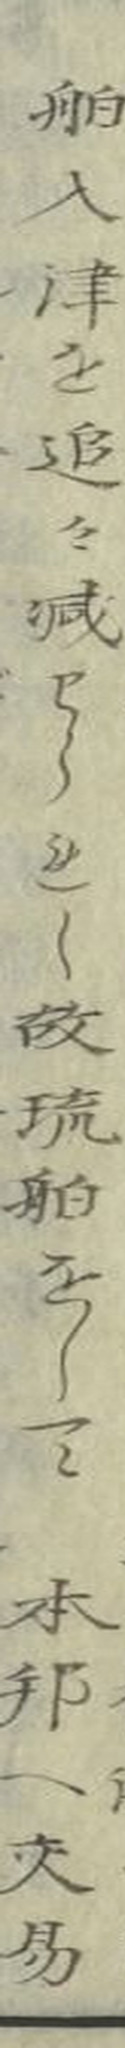舶入津を追々減らせられし故琉舶をして本邦へ交易
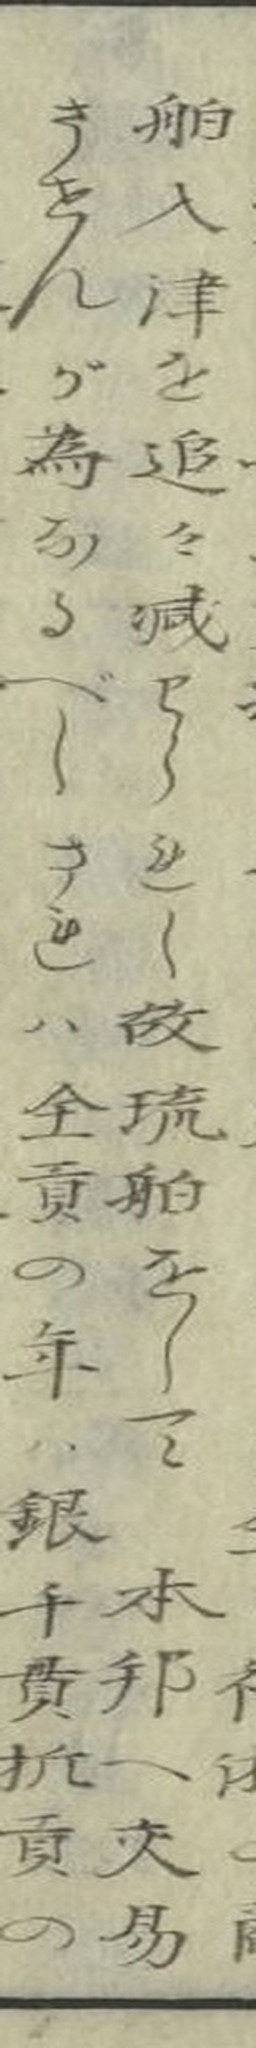させんが為なるべしされは全貢の年は銀千貫折貢の
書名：琉球沿革志 下
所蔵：University of the Ryukyus Library
